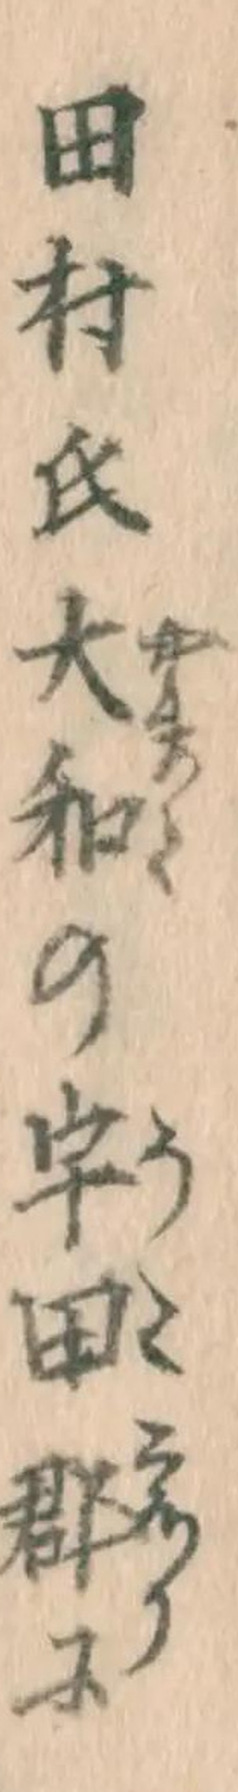田村氏大和の宇田郡に
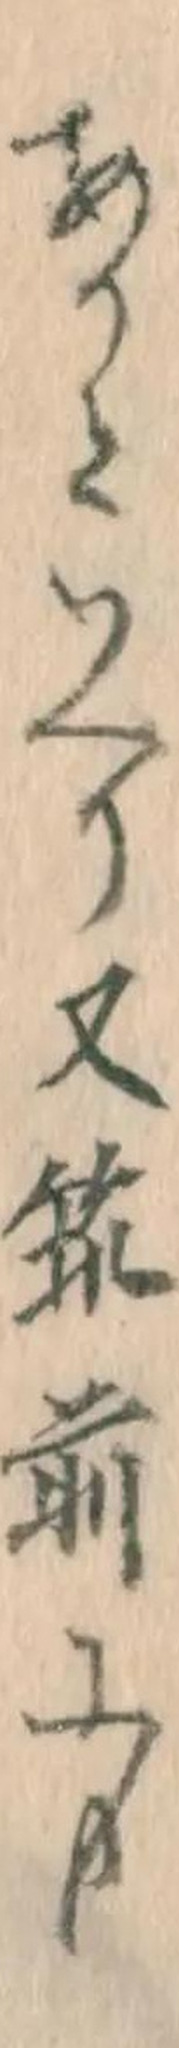ありといへり又筑前にも
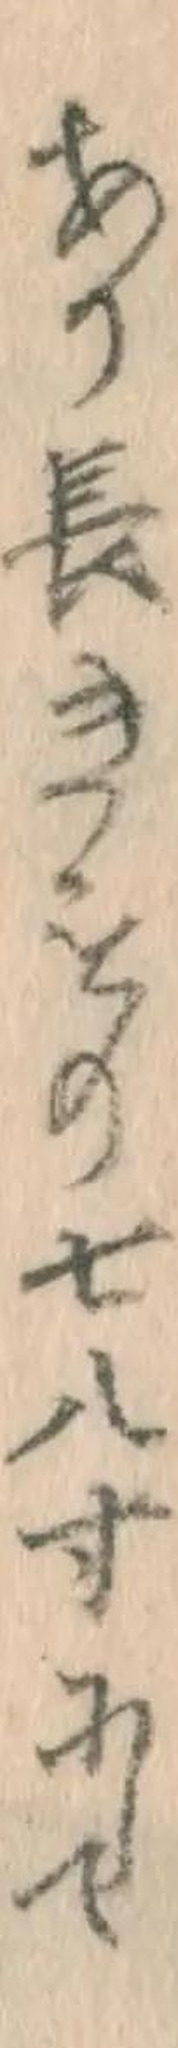あり長きもの七八寸にして
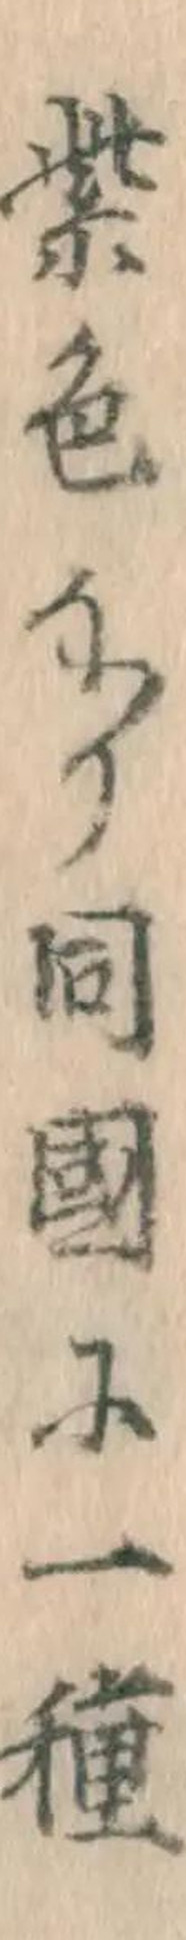紫色なり同国に一種
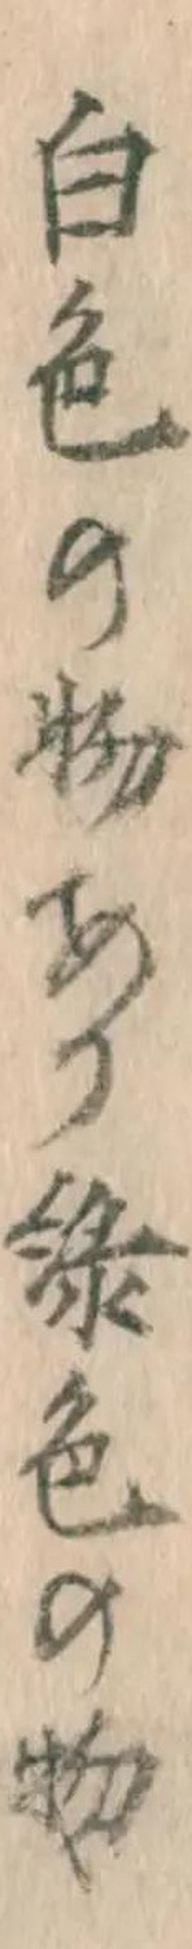白色の物あり緑色の物
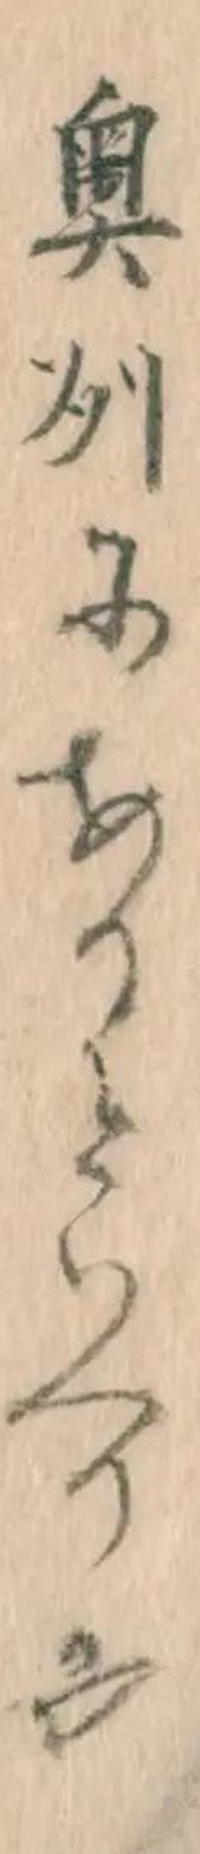奥州にありといへり●○
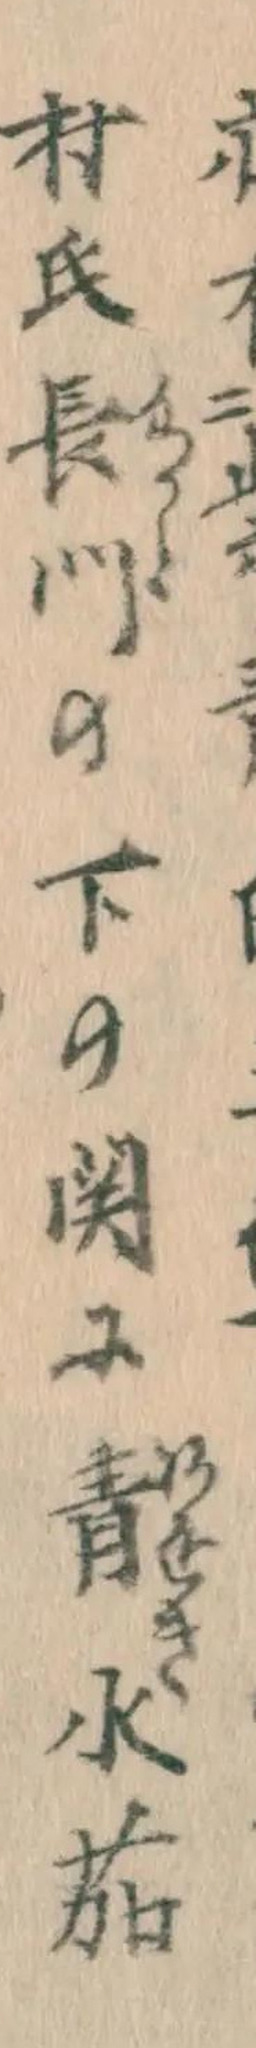村氏長門の下の関に青水茄
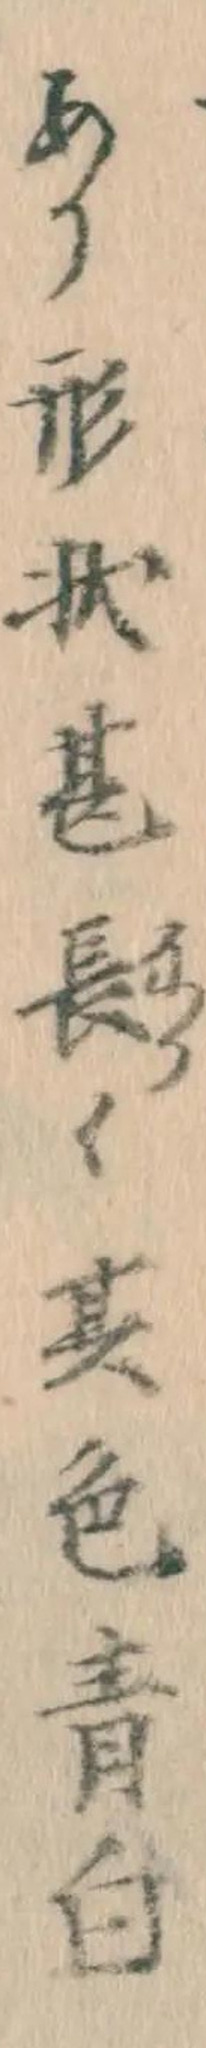あり形状甚長く其色青白
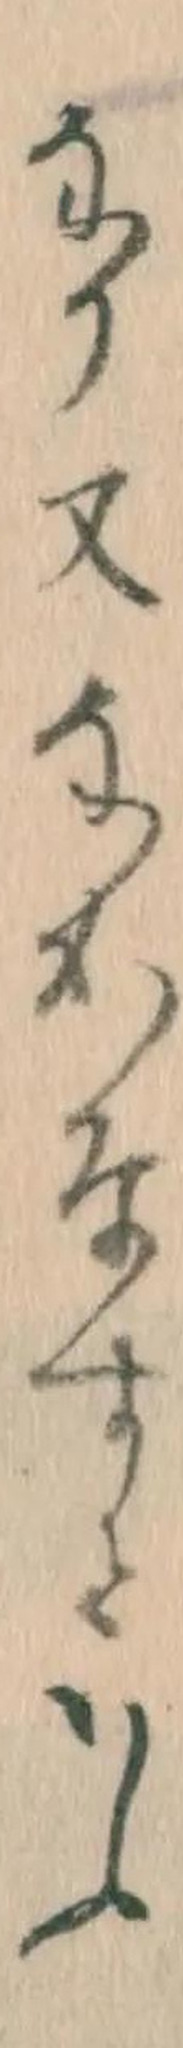なり又なかなすといふ
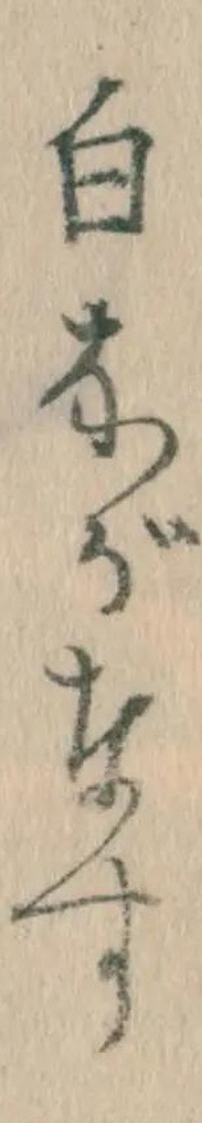白ながなす

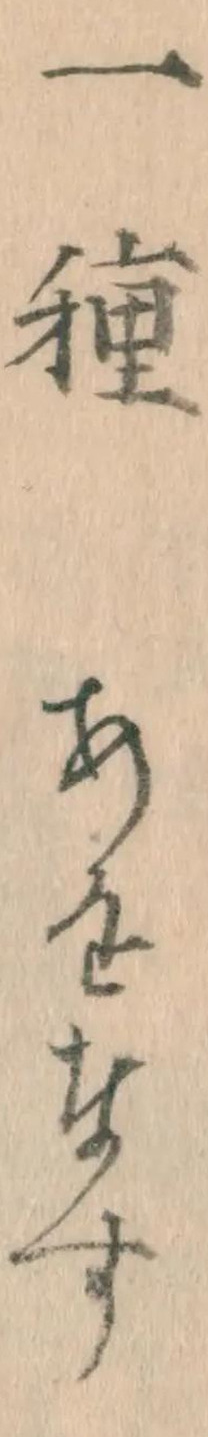一種あをなす
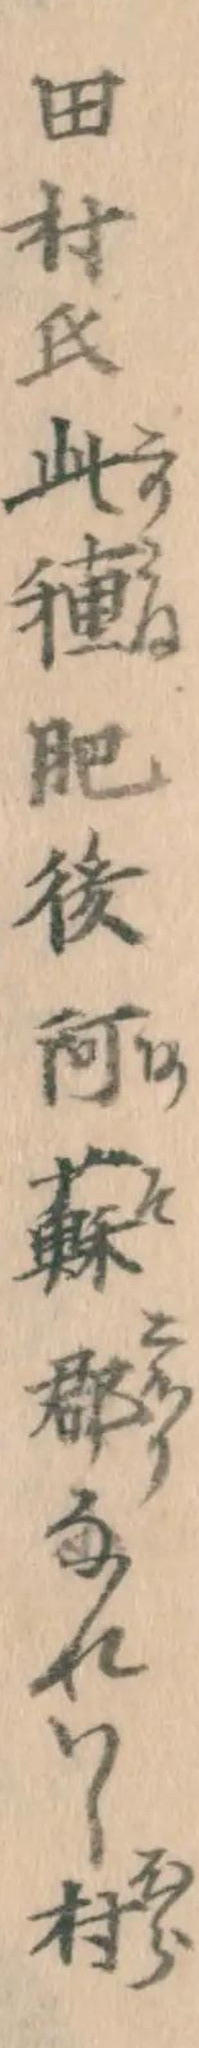田村氏此種肥後阿蘇郡なれいし村
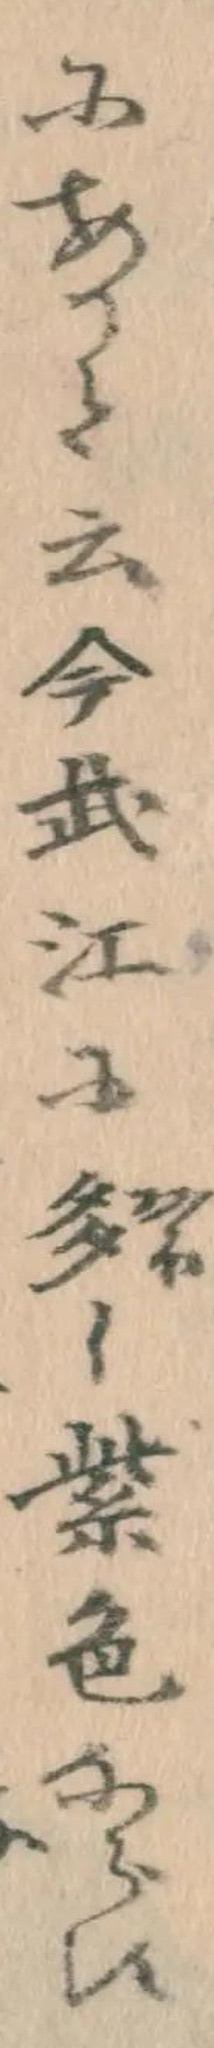にありと云今武江に多し紫色ならす
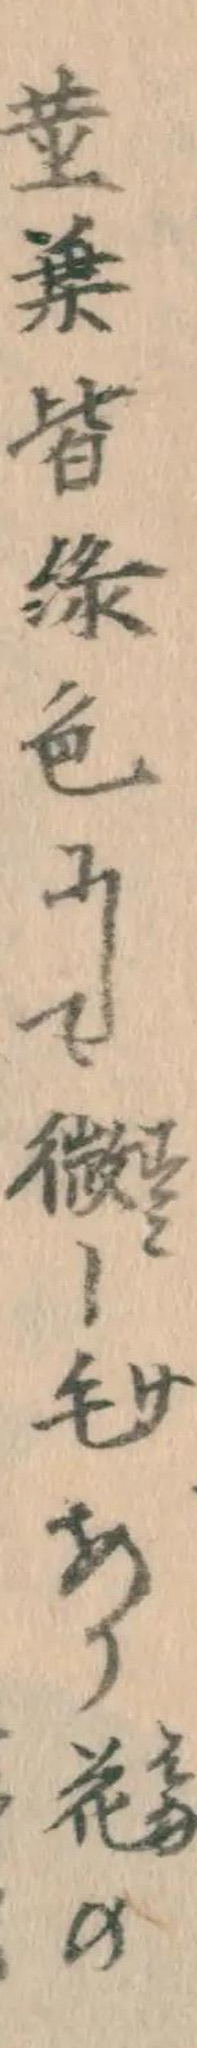茎葉皆緑色にして微し毛あり花の
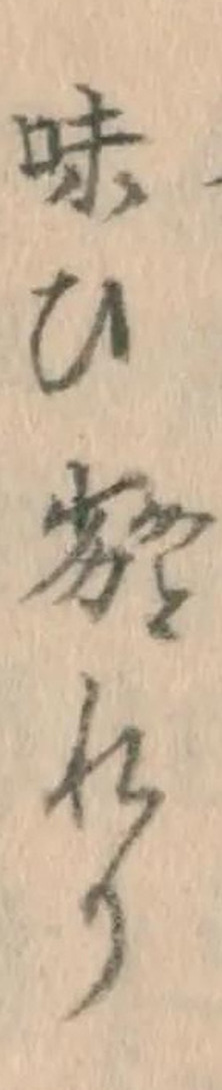味ひ劣れり
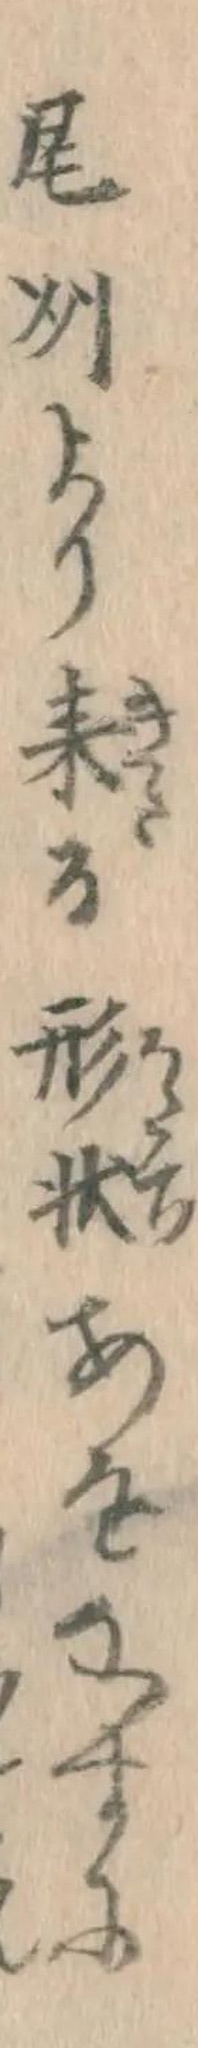尾州より来る形状あをなすに
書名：本草図譜. 巻52-54
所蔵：国立国会図書館 National Diet Library, JAPAN
